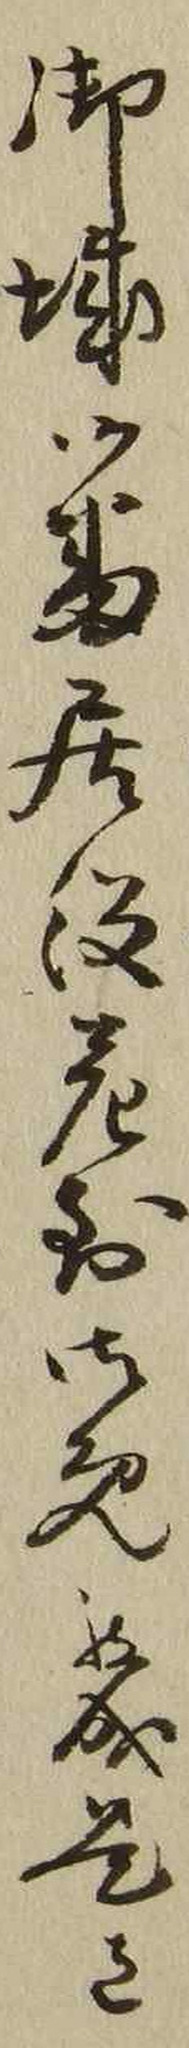御城御番居役差到御免被成是迄
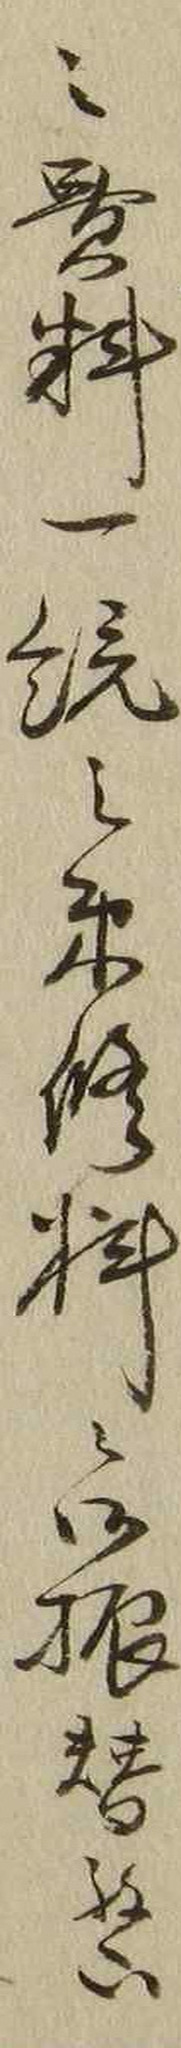之費料一統之束修料ニ御振替被下
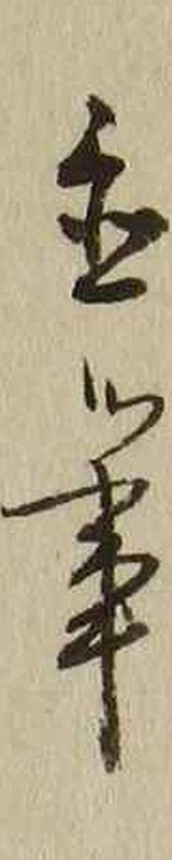置候事
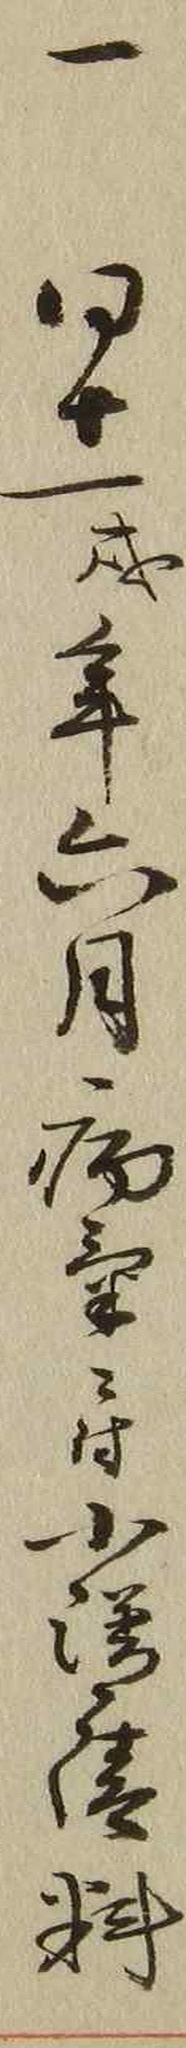一同十一戌年六月病気ニ付小普請料
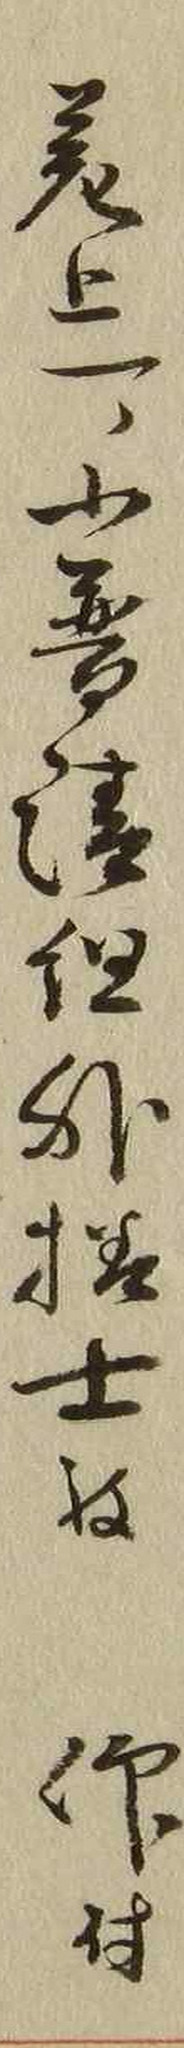差上一ノ小普請組外様士被仰付
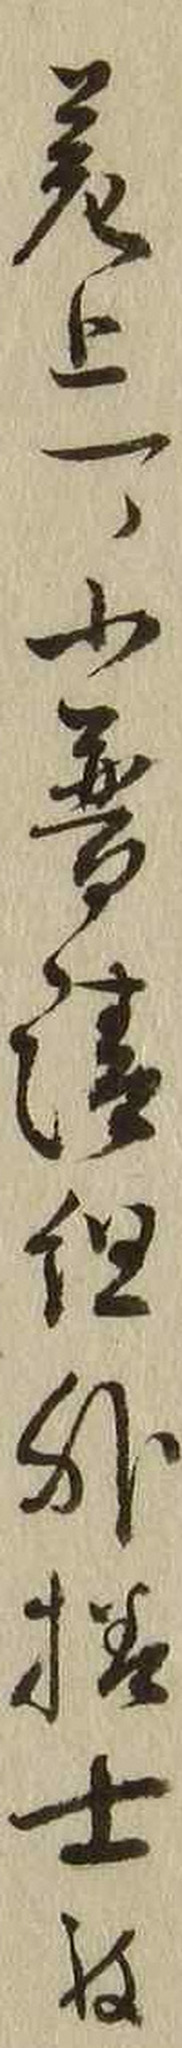差上一ノ小普請組外様士被仰付
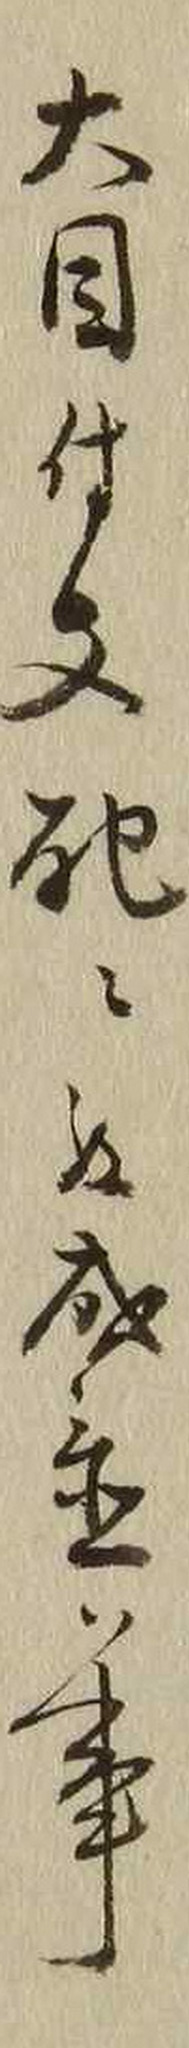大目付支配ニ被成置候事
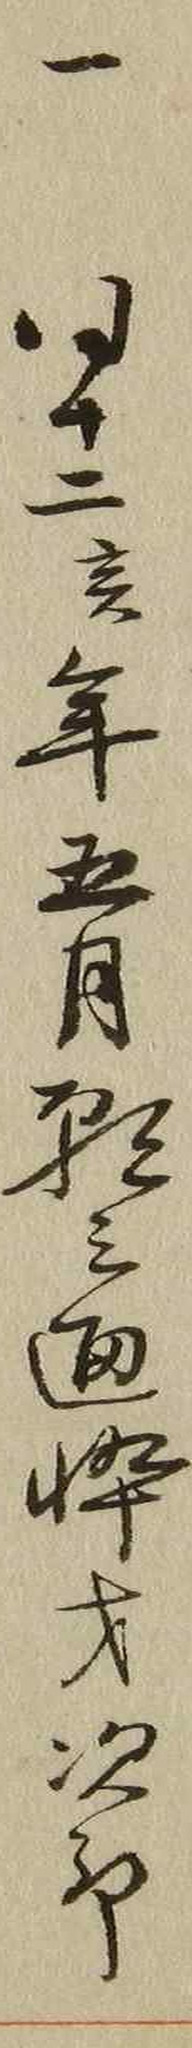一同十二亥年五月願之通忰才次郎
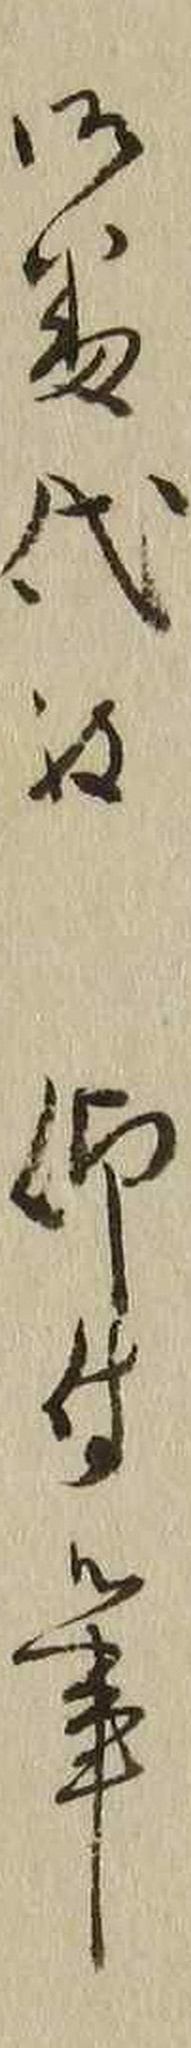御番代被仰付候事
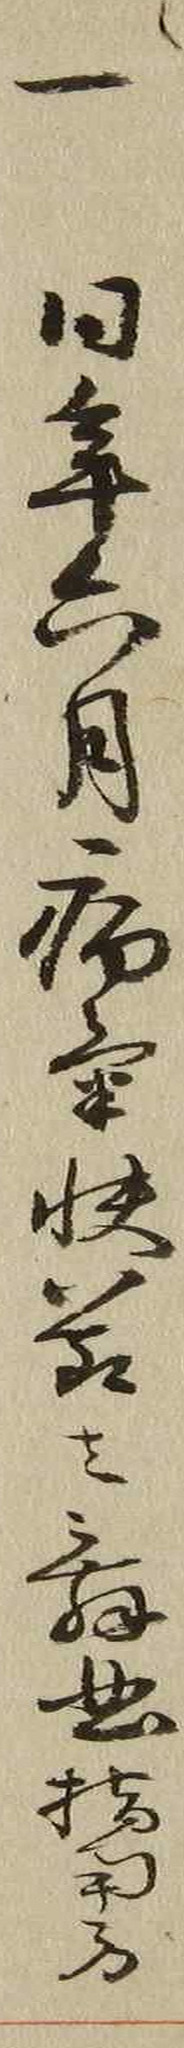一同年六月病気快節者舞曲指
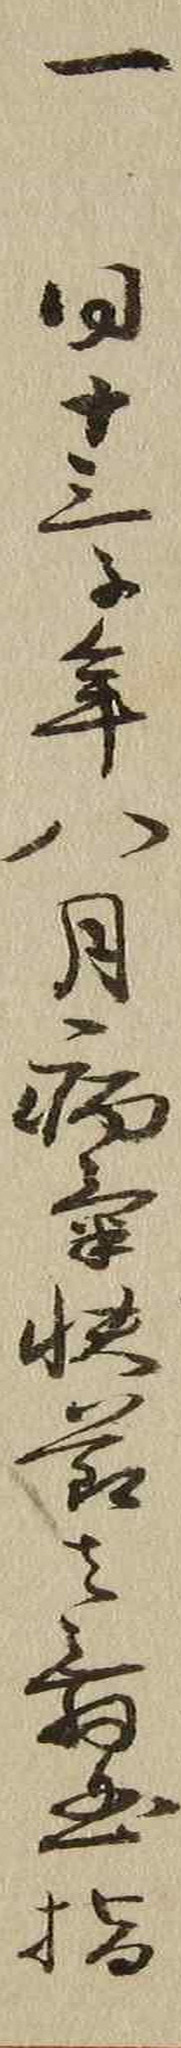一同十三子年八月病気快節者舞曲指
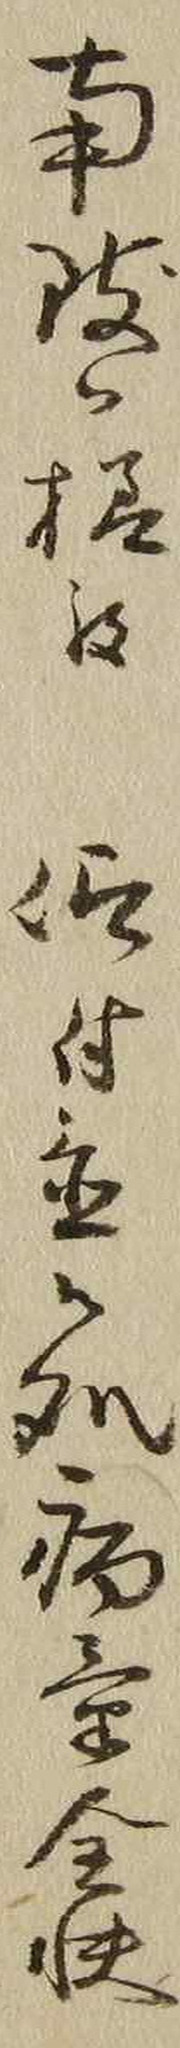南致候様被仰付置候処病気全快
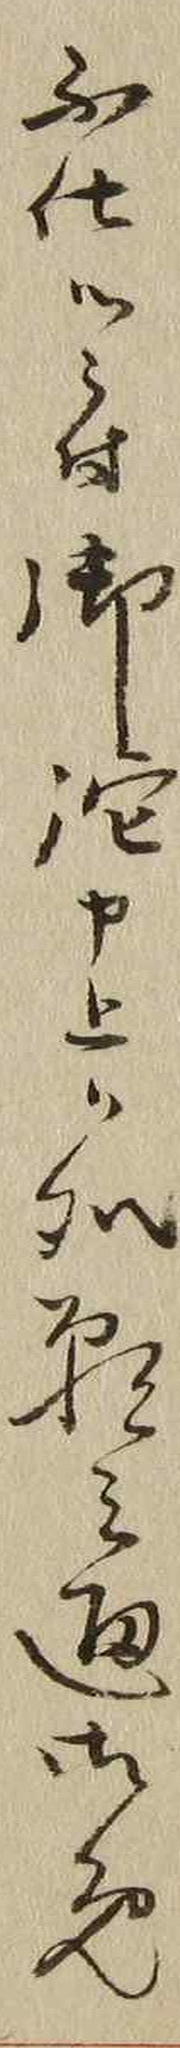不仕候ニ付御侘申上候処願之通御免
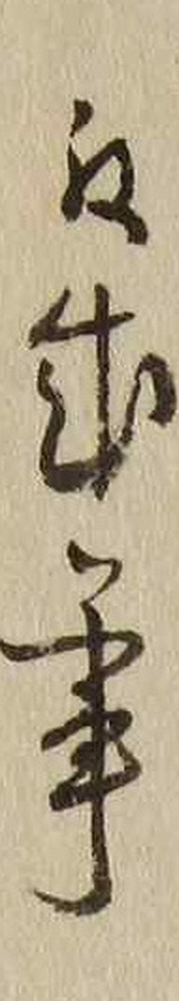被成候事
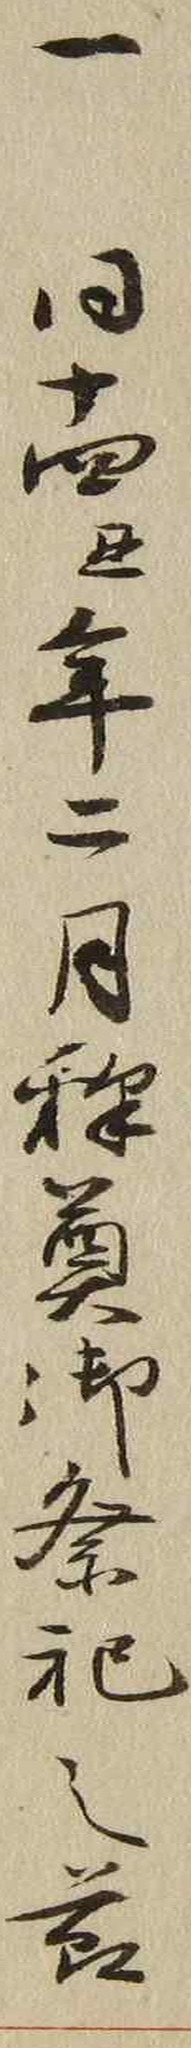一同十四丑年二月釈奠御祭祀之節
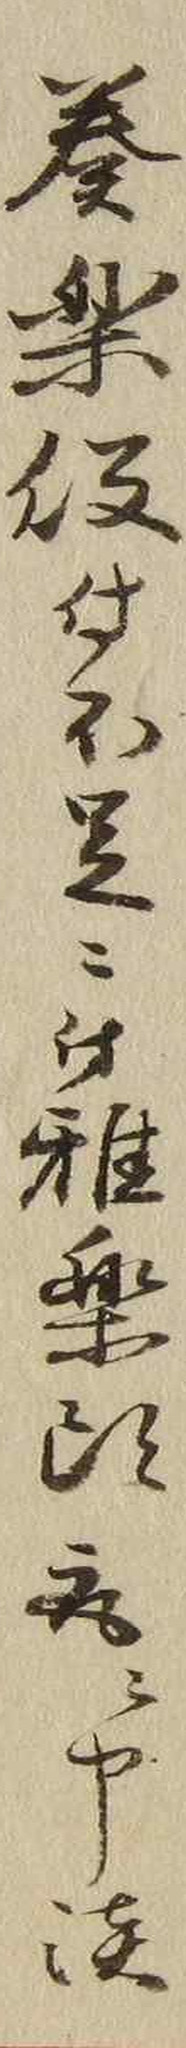奏楽役付不足ニ付雅楽頭取ニ申談
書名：諸士系譜　巻之221　ま之部2
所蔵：会津若松市立会津図書館
